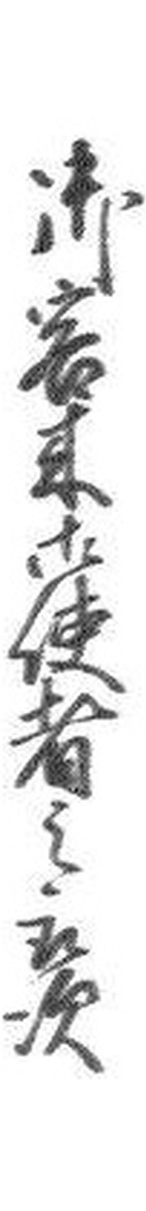御客来御使者之取次
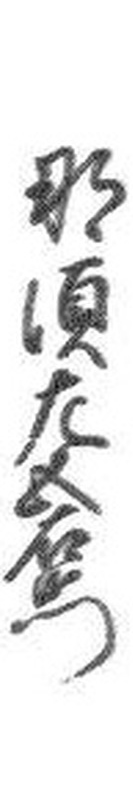那須左五右衛門
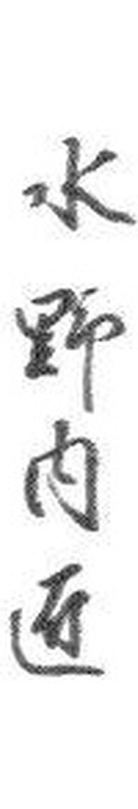水野内匠
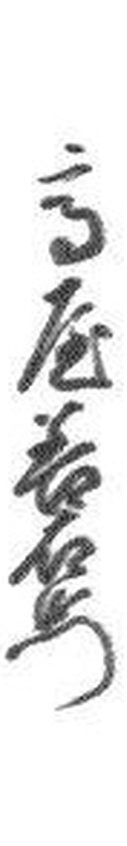高屋善右衛門
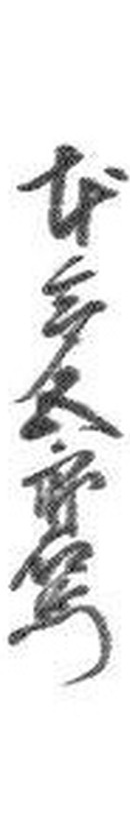本多五郎右衛門
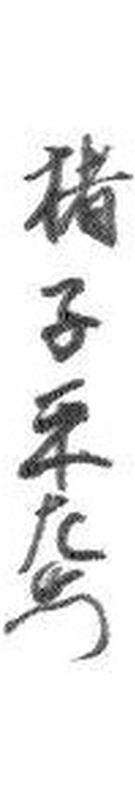猪子平左衛門

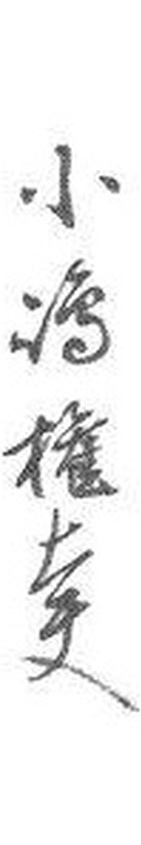小嶋権太夫
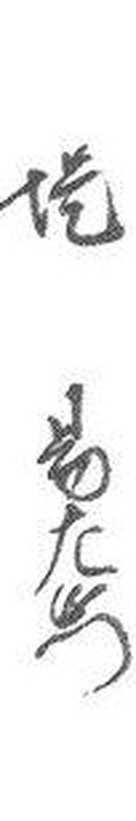堤易左衛門
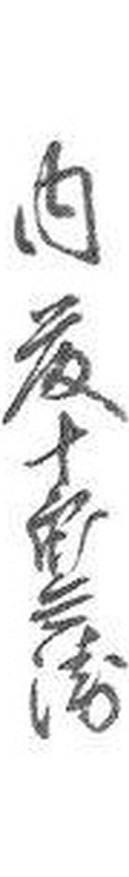内藤十郎兵衛
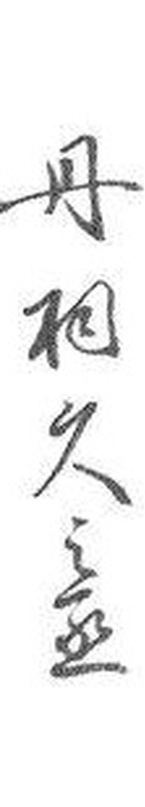丹羽久之丞
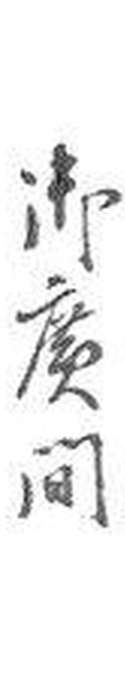御広間
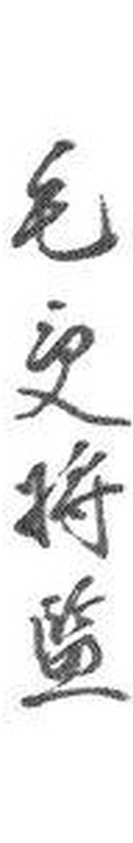毛受将監
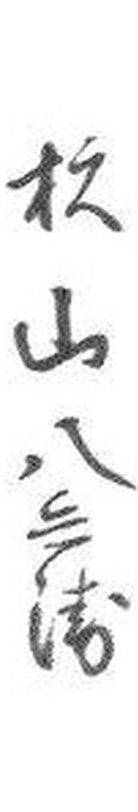杉山八兵衛
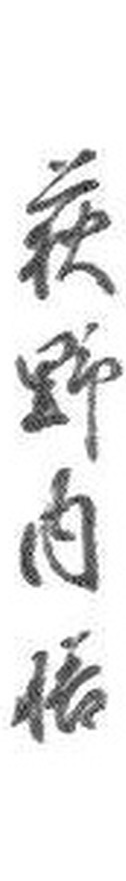荻野内膳
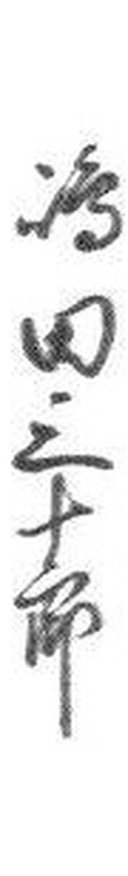嶋田三十郎
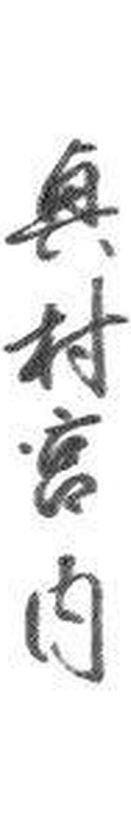奥村宮内
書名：家譜 四 忠昌公 従寛永七年到正保四年
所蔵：福井県文書館 Fukui Prefectural Archives
